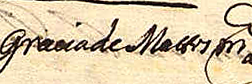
Gracia de Mattos mer
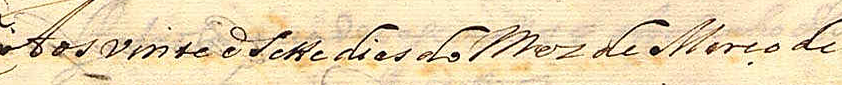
Aos vinte e sette dias do Mez de Março de
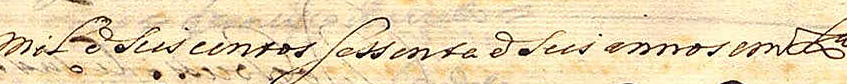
mil e seiscentos Sessenta e seis anos em Lxa
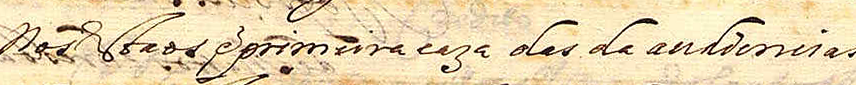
no Estaos e primeira caza das da audiencias
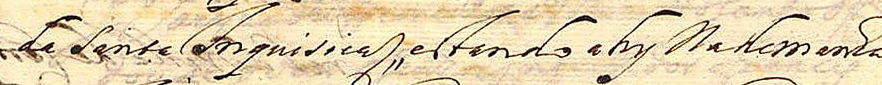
da santa Inquisicaꝭ,, estando ahy Na de manha
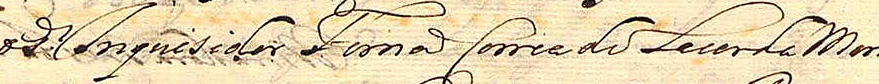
o sor. Inquisidor Fernā Correa de Lacerda Man
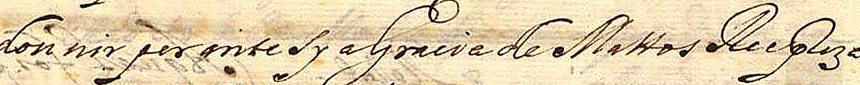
dou uir perante sy a Gracia de Mattos Ree p̄reza
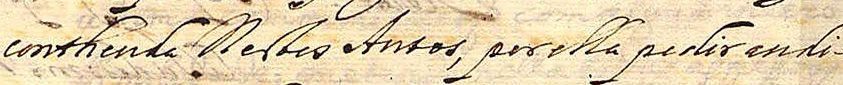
contheuda Nestes Autos, por ella pedir audi
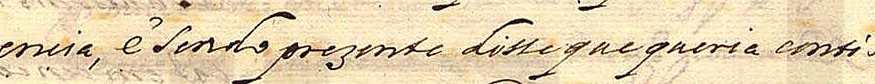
encia, e sendo prezente disse que queria conti
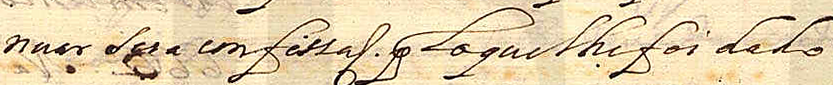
nuar sua confissaõ. p̄Lo que lhe foi dado
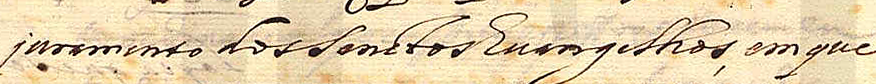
juramento dos sanctos Euangelhos, em que
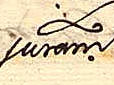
juramto
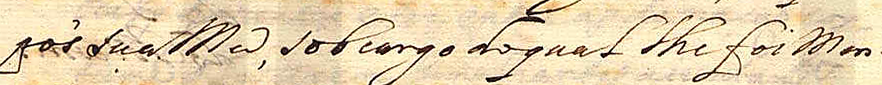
pos̄ sua Mā, sob cargo do qual lhe foi Man
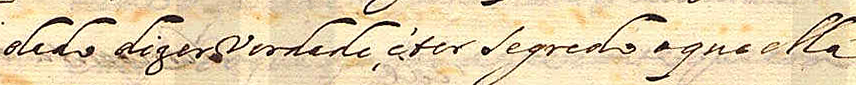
dado dizer verdade, e ter segredo o que ella
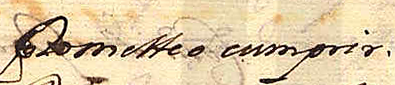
p̄rometteo cumprir.
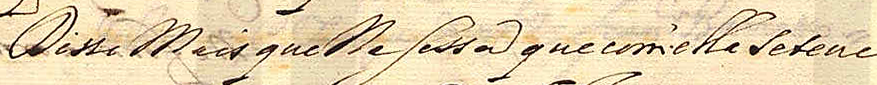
Disse Mais que Na Sessā que com ella se teue
